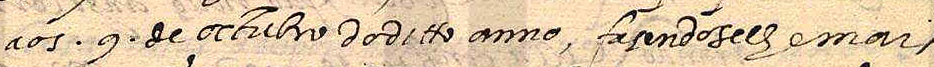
aos .9. de octubro do ditto anno, fazendoselhe mais
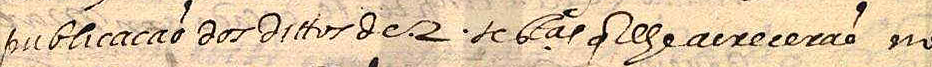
publicacaõ dos dittos de .2. testas q̄ lhe acreceraõ no
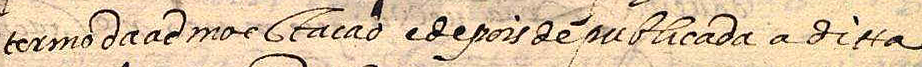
termo da admoestacaõ e depois de publicada a ditta
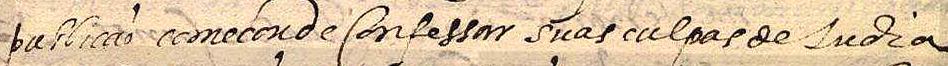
publicaõ comecou de Confessar suas culpas de Iudia
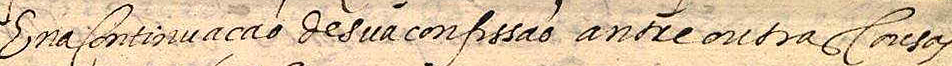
E na Continuaçaõ de sua confissaõ antre outras Cousas
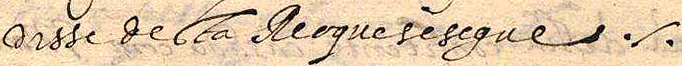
disse desta Re o que se segue ./.
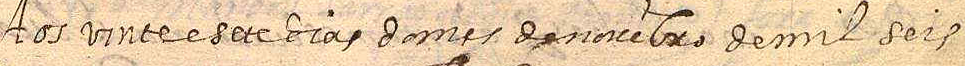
Aos vinte e sete dias do mes de nouēbro de mil seis
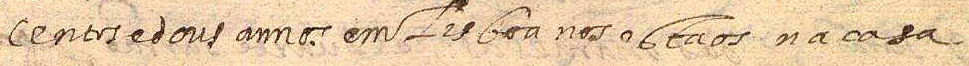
centos e dous annos em Lisboa nos estaos na casa
